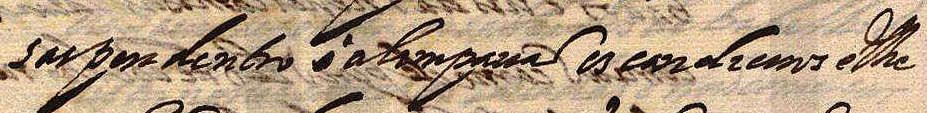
sas pera dentro e alimpauaõ os candieiros e lhe
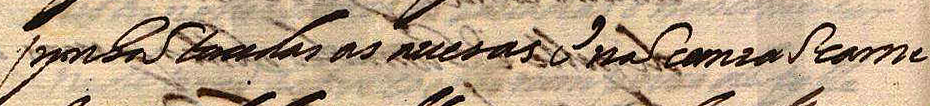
punhaõ torcidas as auesas e naõ comiaõ carne
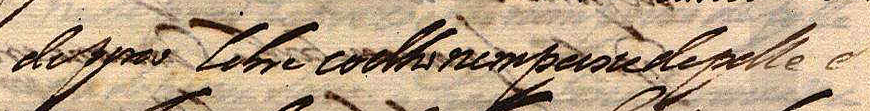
de porco lebre coelho nem peixe de pelle e
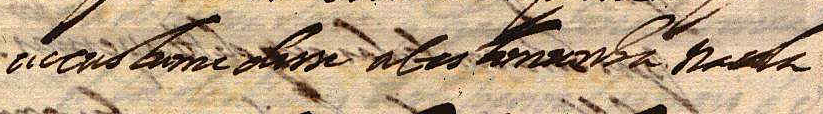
ao custume disse a testemunha nada
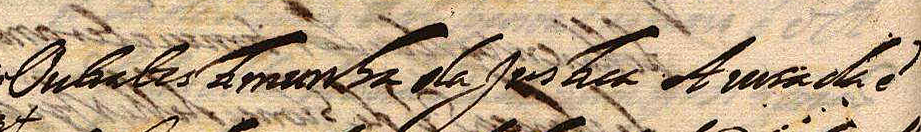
Outra testemunha da Justiça A iurada e
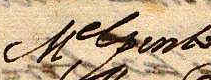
Mel pinto
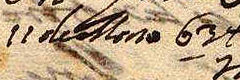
11 de Maio 634
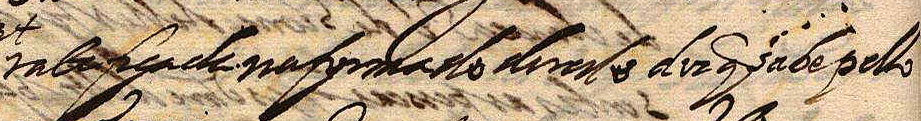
rateficada na forma do direito diz q̄ sabe pello
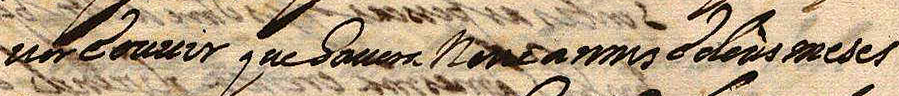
uer e ouuir que hauera nove annos e dous meses
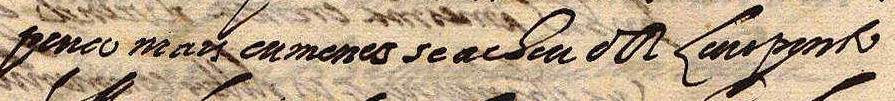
pouco mais ou menos se achou o R Luis pinto
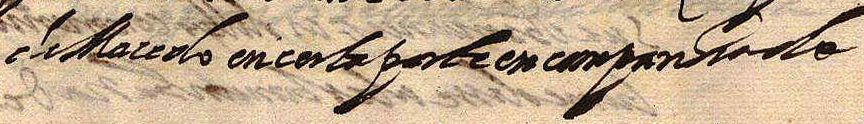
de Macedo en certa parte en companhia do
